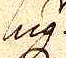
lugr.
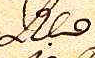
Reo
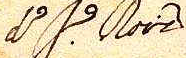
do J.o Roiz̄
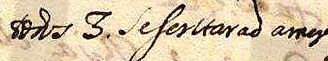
todos 3 se sentaraõ a meza
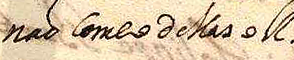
naõ comeo dellas o R.
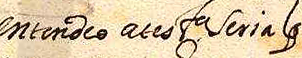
entendeo a testa. seria ꝓ
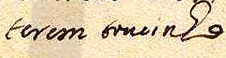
terem toucinho
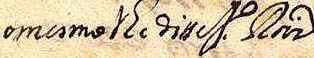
o mesmo lhe disse J.o Roiz̄
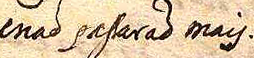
e naõ passaraõ mais.
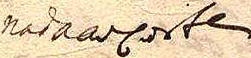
nada ao coste
